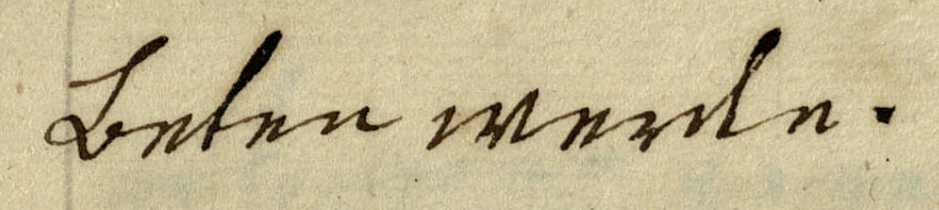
beten werden.
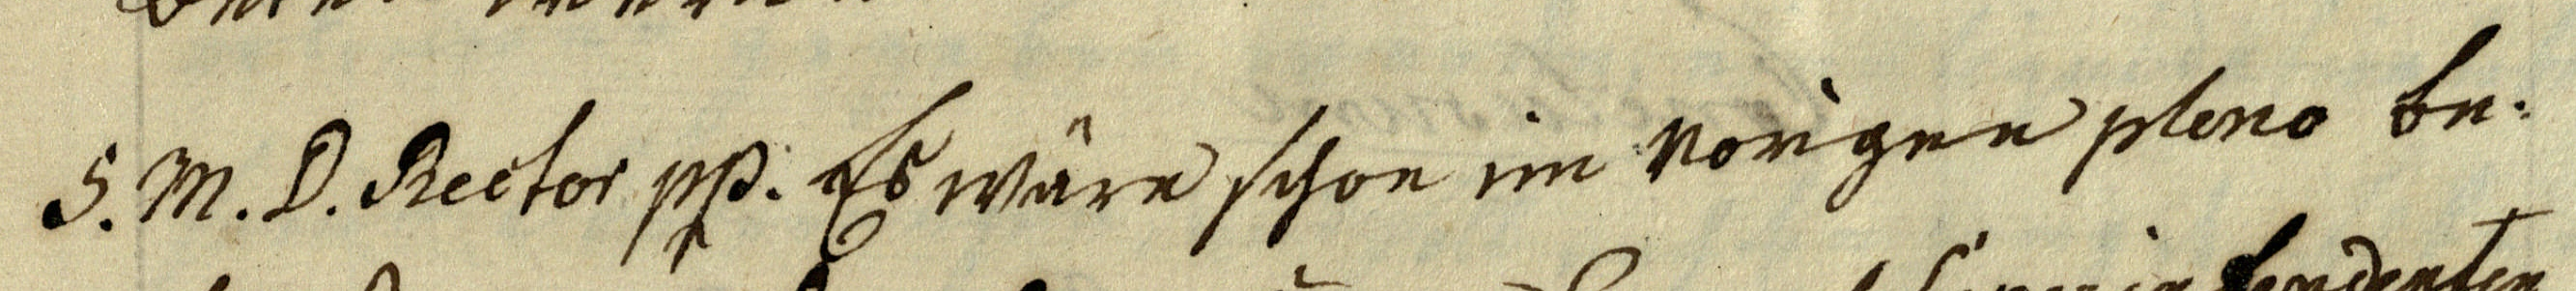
5. M. D. Rector pp. Es wäre schon im vorigen pleno be¬
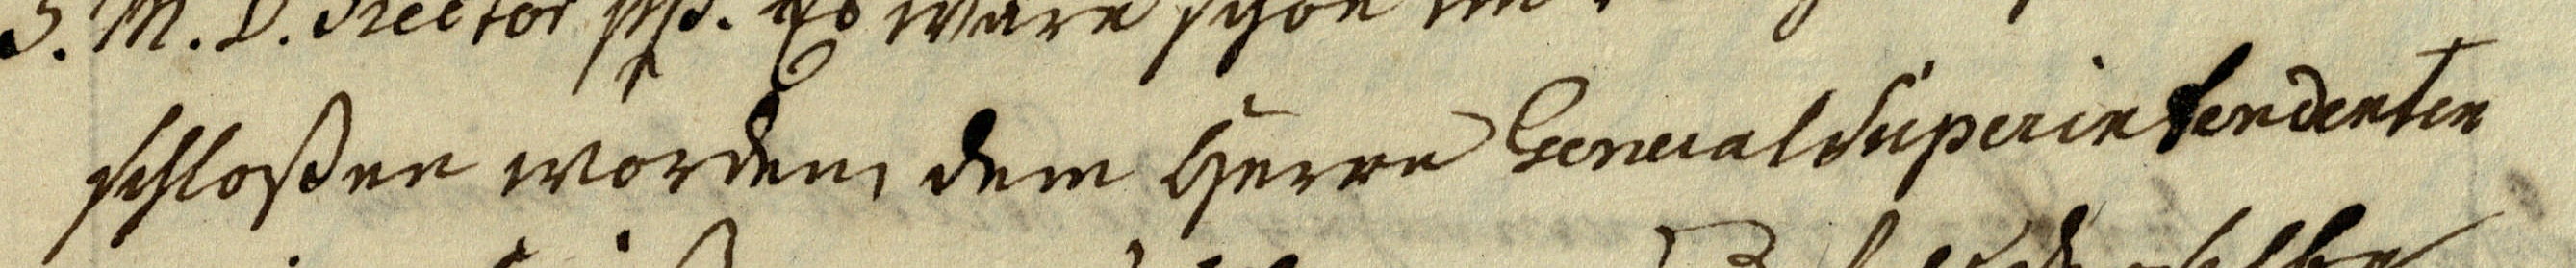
schloßen worden, dem Herrn GeneralSuperintendenten
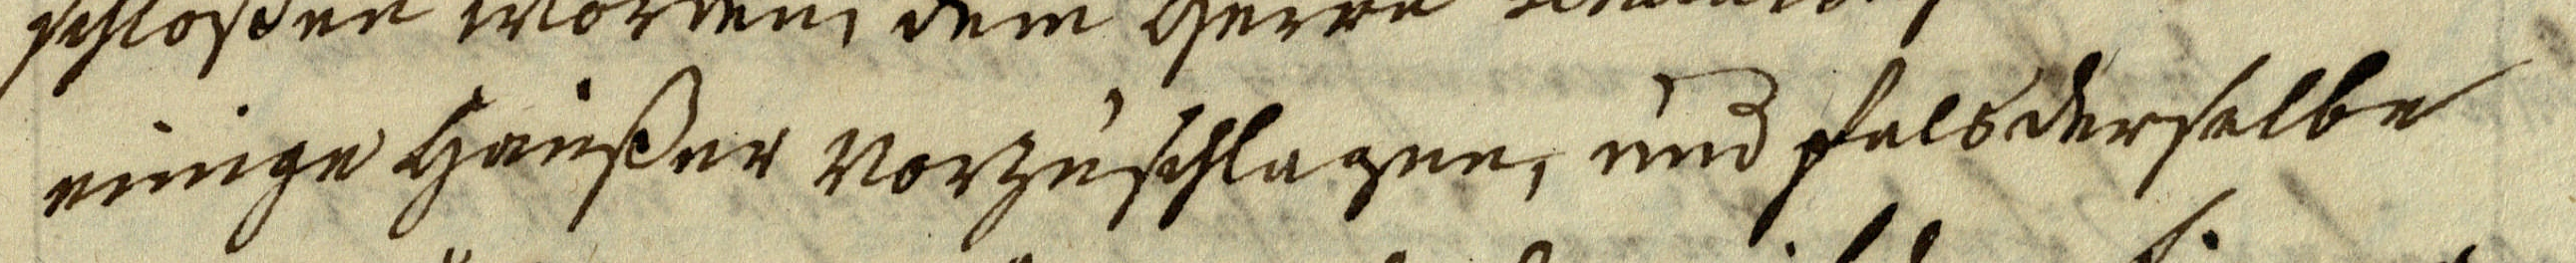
einige Häuser vorzuschlagen, und fals derselbe
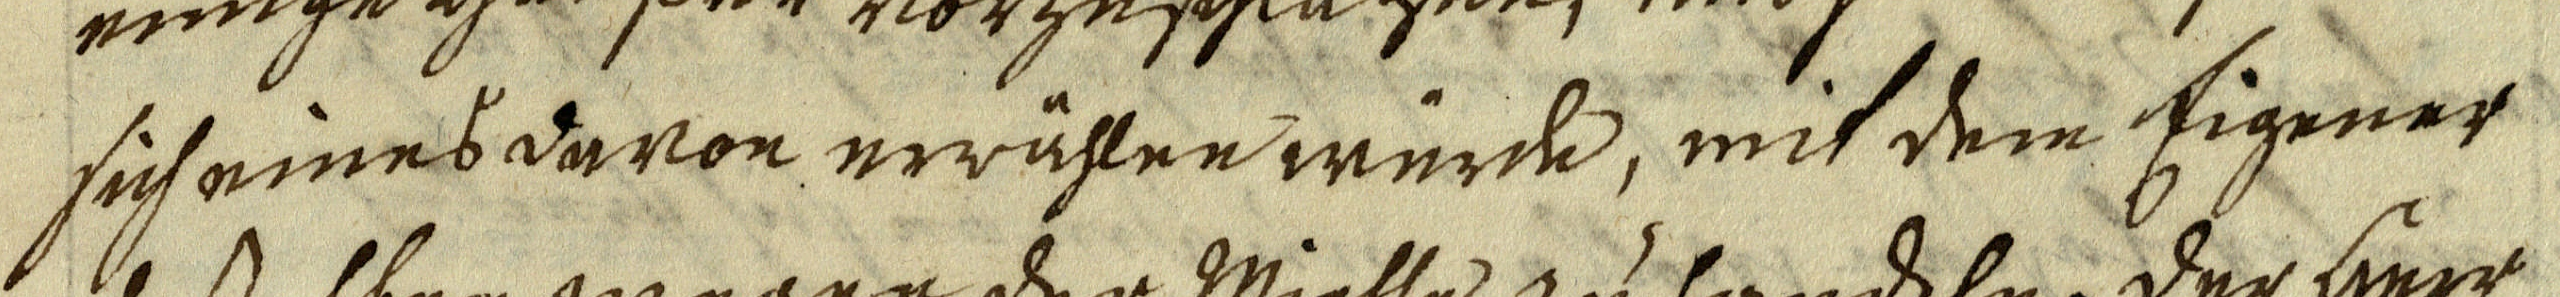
sich eines davon erwählen würde, mit dem Eigener
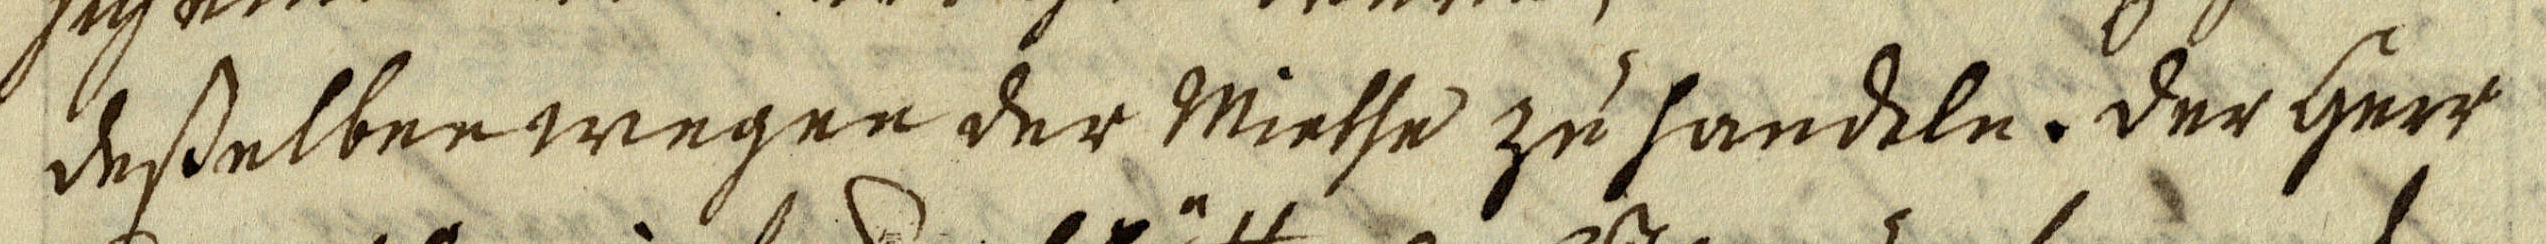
deßelben wegen der Miethe zu verhandeln. Der Herr
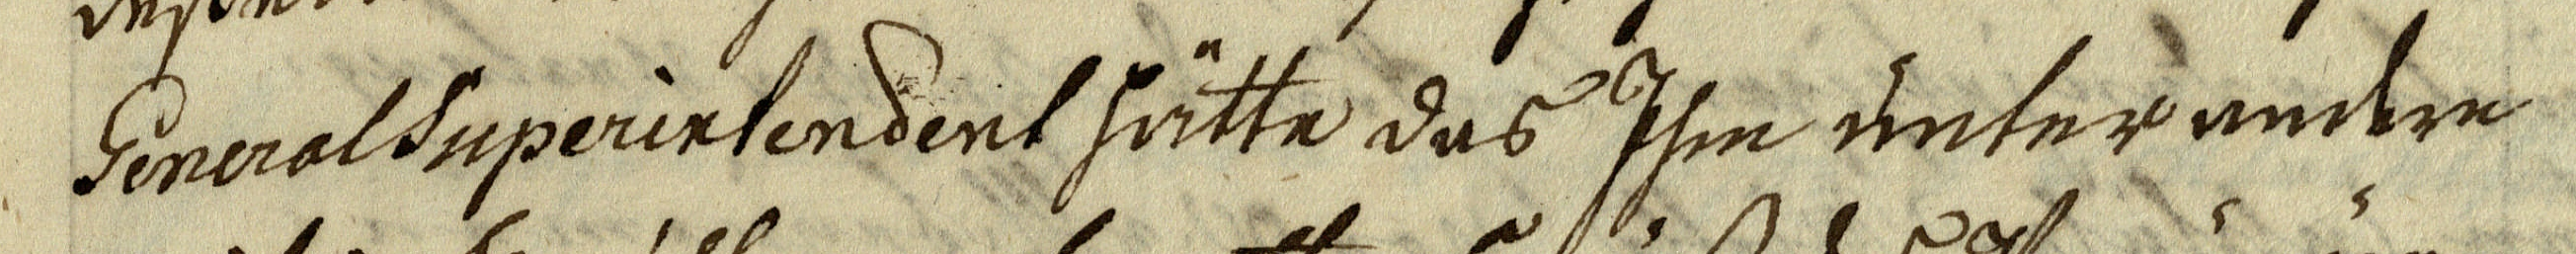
GenralSuperintendent hätte das Ihm unter andern
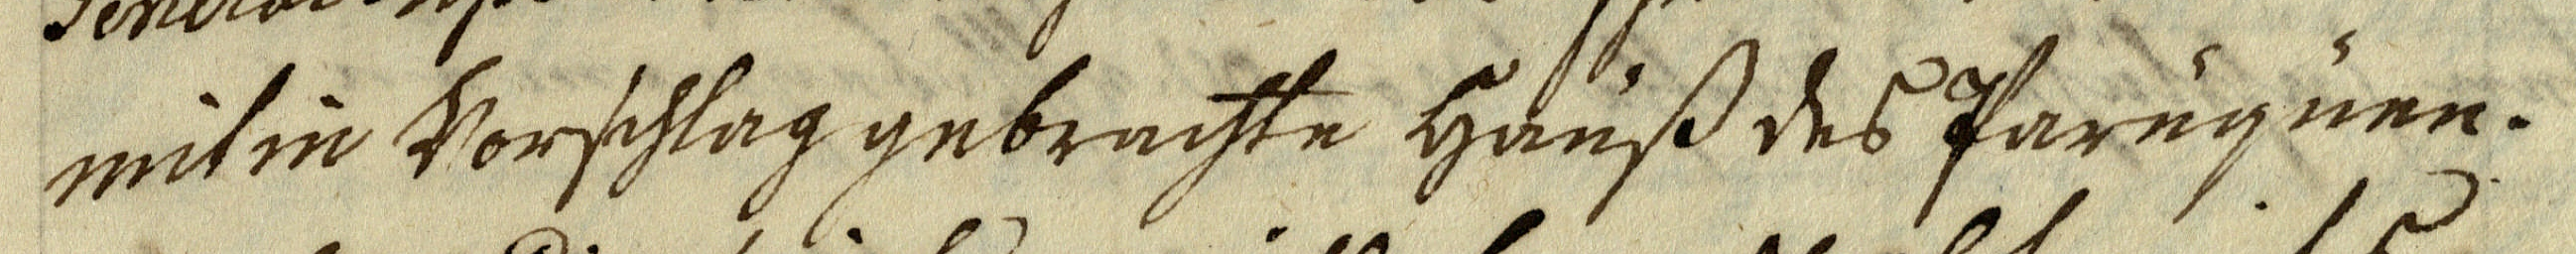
mit in Vorschlag gebrachte Hauß des Paruquen¬
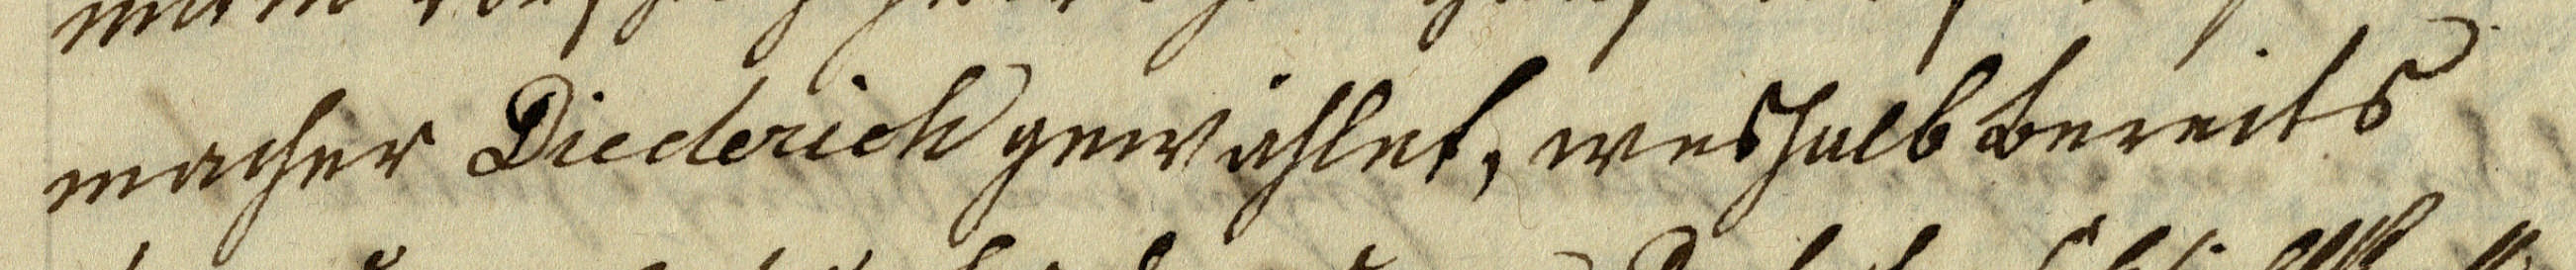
macher Diederich gewählet, weshalb bereits
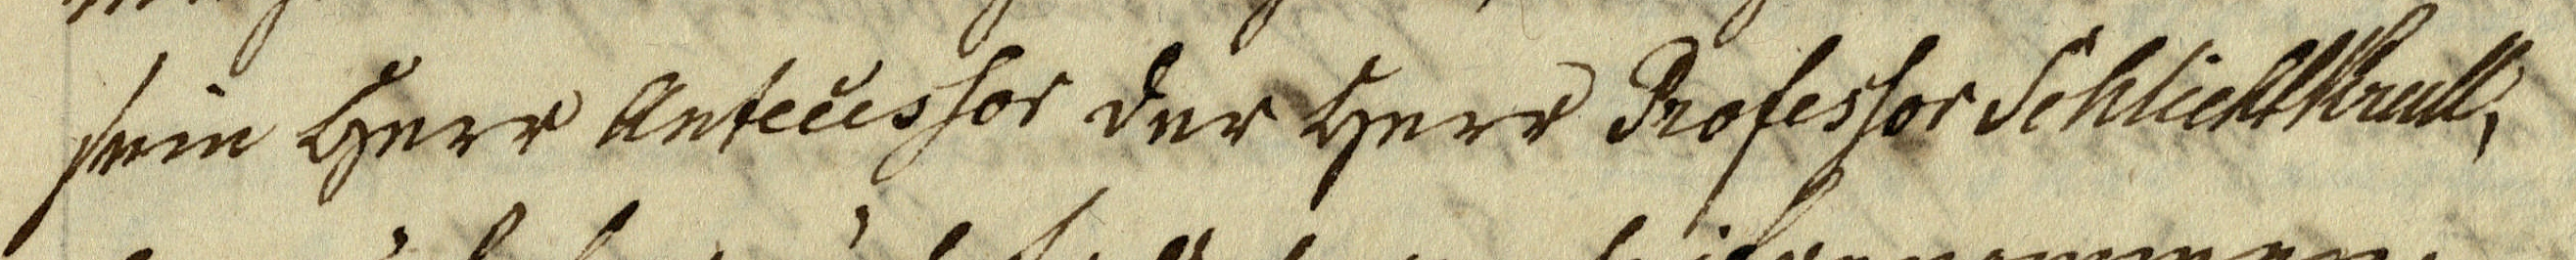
sein Herr Antecessor der Herr Professor Schlichtkrull,
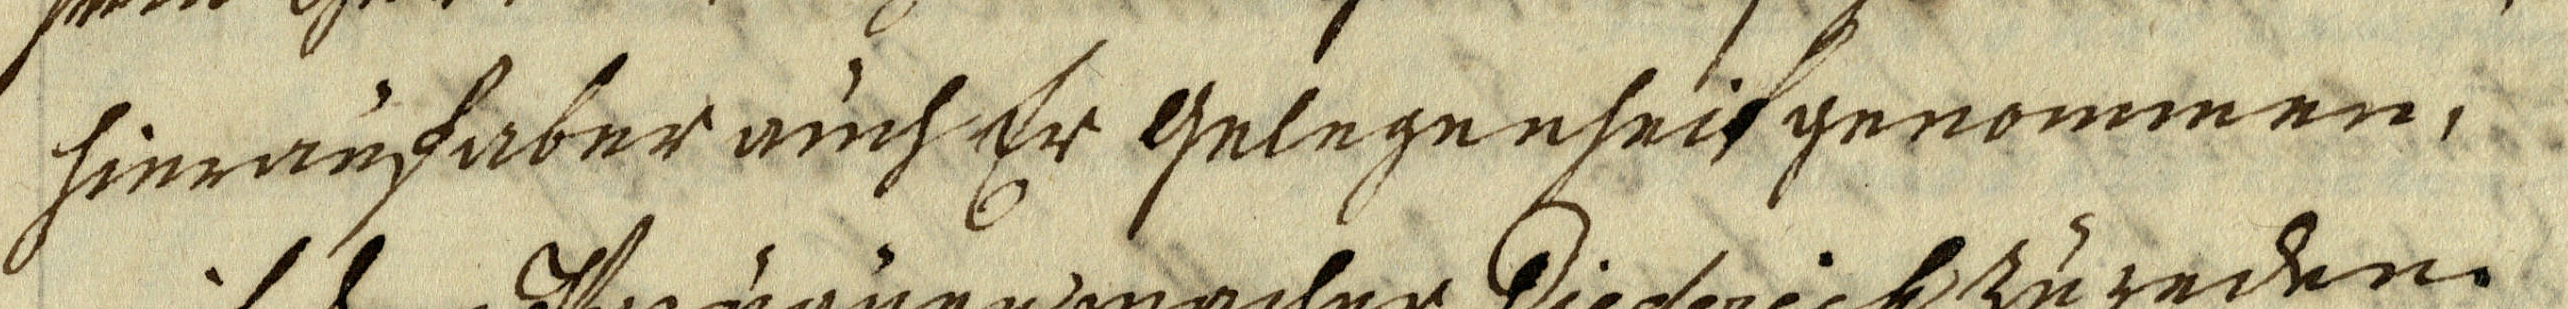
hierauf aber auch Er Gelegenheit genommen,
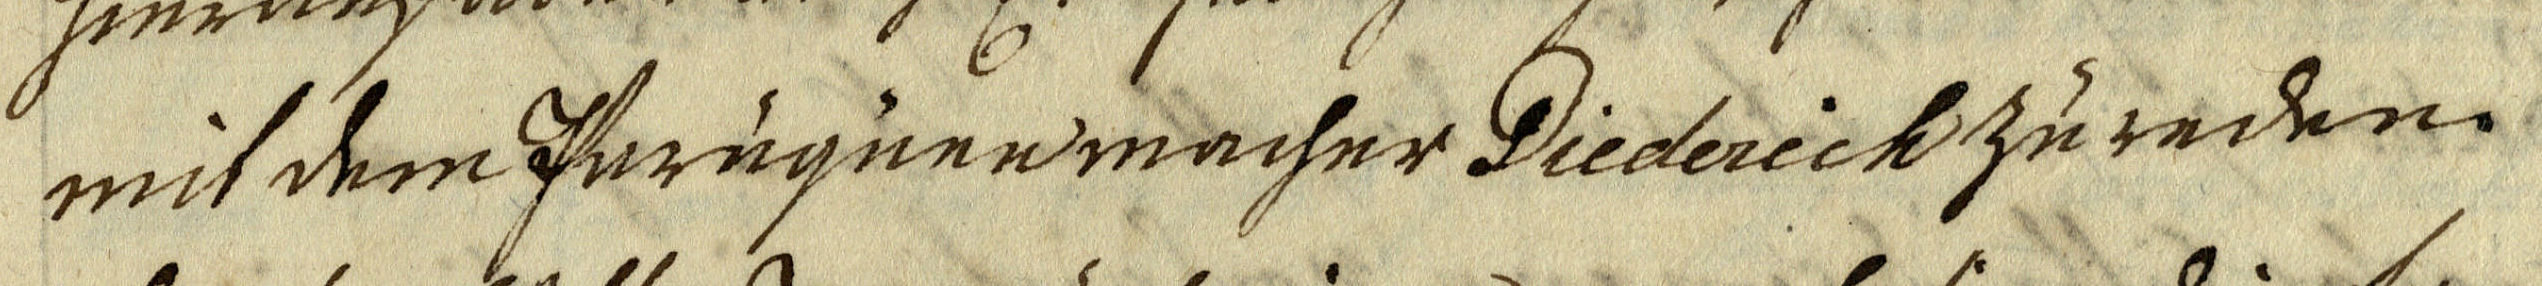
mit dem Paruquenmacher Diederich zu reden.
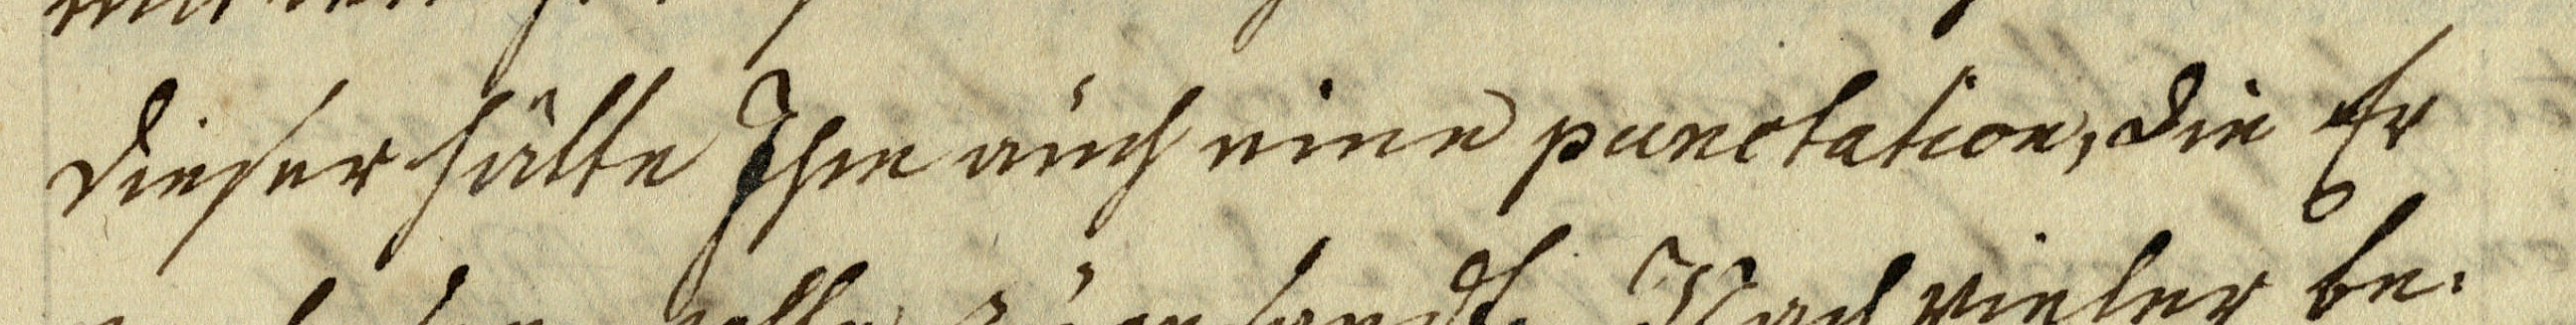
Dieser hätte Ihm auch eine punctation, die Er
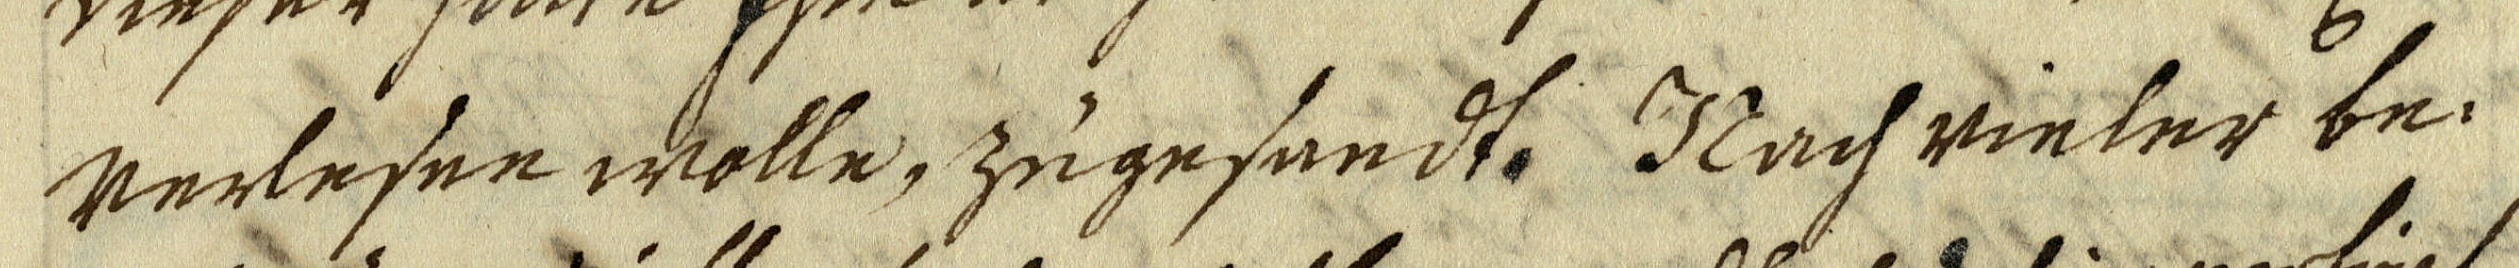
verlesen wolle, zugesandt. Nach vieler Be¬
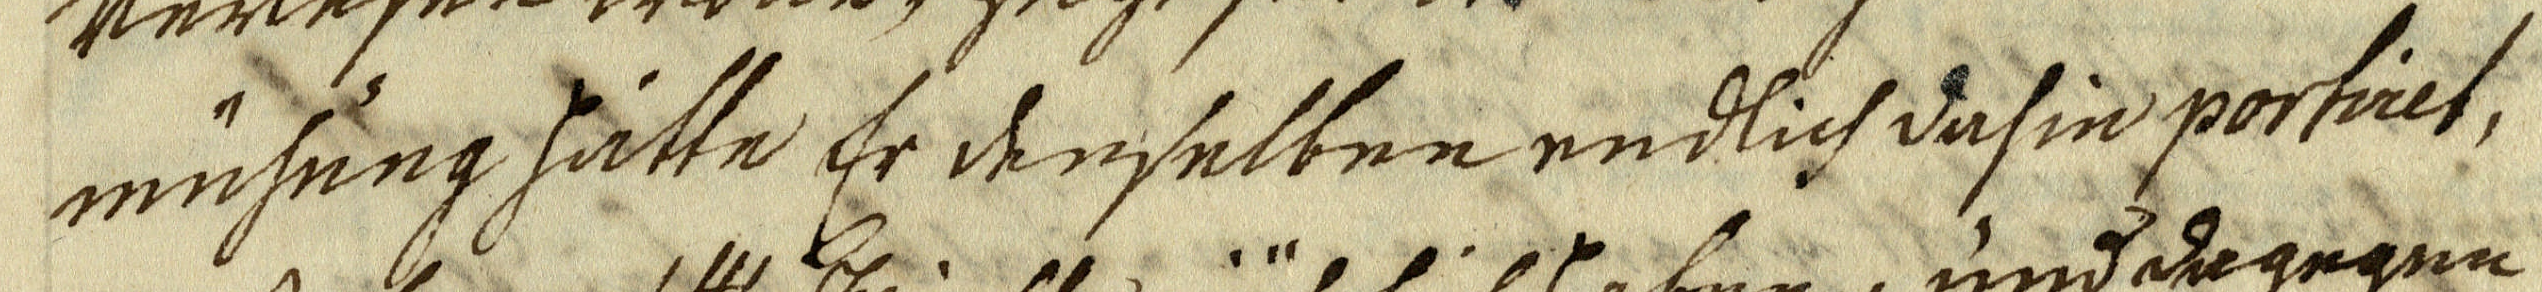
mühung hätte Er denselben endlich dahin portiret,
